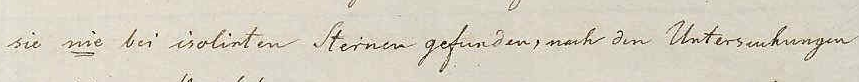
sie nie bei isolirten Sternen gefunden, nach den Untersuchungen
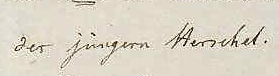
des jüngern Herschel.
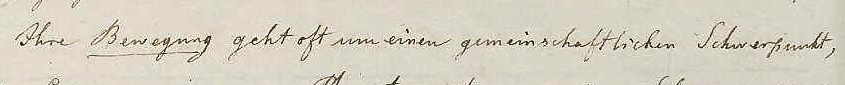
Ihre Bewegung geht oft um einen gemeinschaftlichen Schwerpunkt,
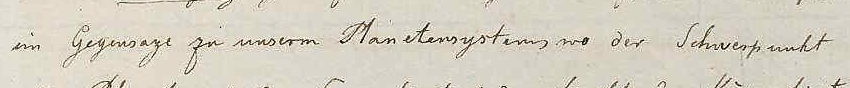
im Gegensaze zu unserm Planetensystem, wo der Schwerpunkt
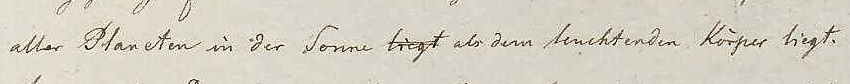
aller Planeten in der Sonne liegt als dem leuchtenden Körper liegt.
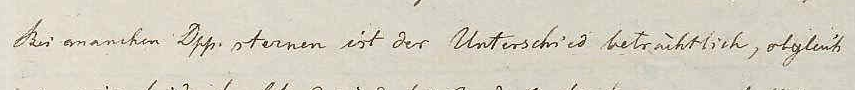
Bei manchen Dpp.sternen ist der Unterschied beträchtlich, obgleich
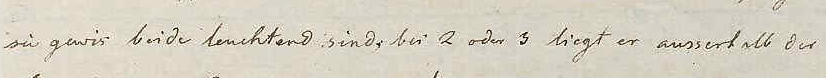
sie gewis beide leuchtend sind: bei 2 oder 3 liegt er ausserhalb der
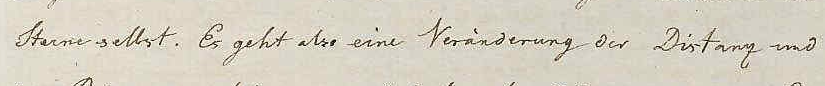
Sterne selbst. Es geht also eine Veränderung der Distanz und
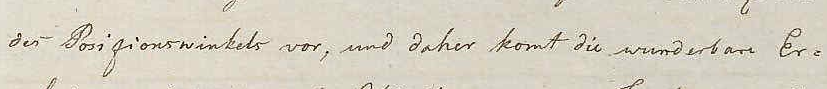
des Positionswinkels vor, und daher komt die wunderbare Er-
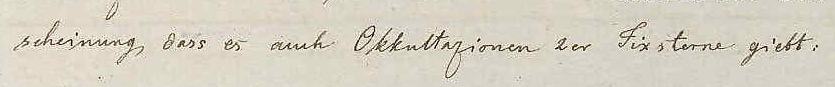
scheinung, dass es auch Okkultazionen 2er Fixsterne giebt:
